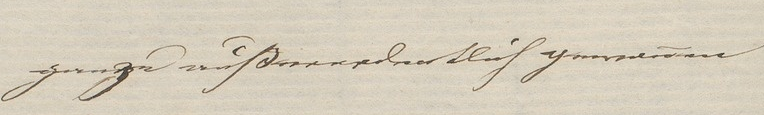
ganze außerordentlich gewonnen
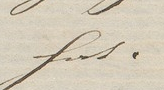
hat.
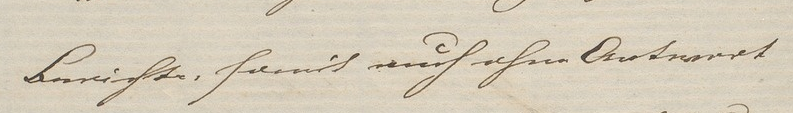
Berichte, somit auch ohne Antwort
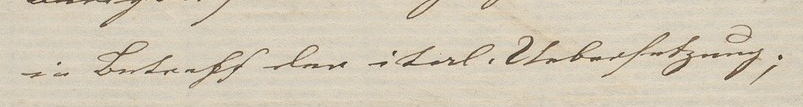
in Betreff der ital. Uebersetzung;
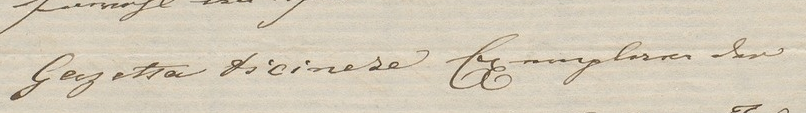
Gazetta ticinese Exemplare der
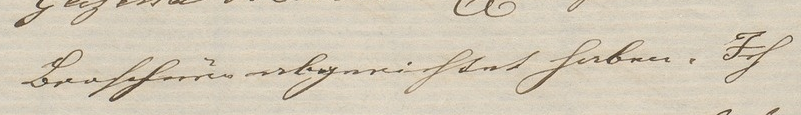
Broschüre abgerichtet haben. Ich
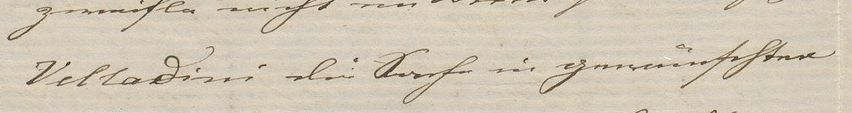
Velladini die Sache in gewünschter
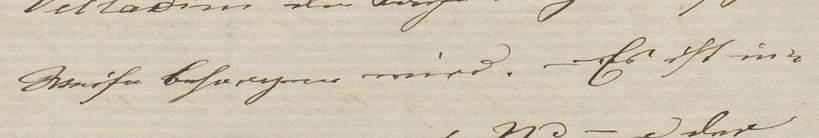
Weise besorgen wird. – Es ist in-
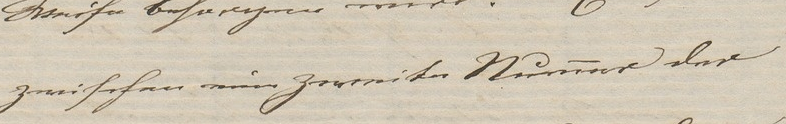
zwischen eine zweite Nummer der
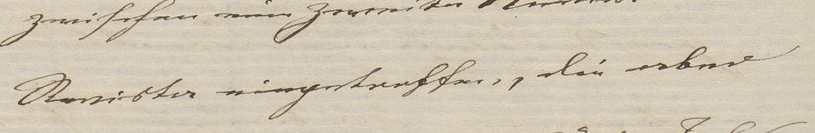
Revista eingetroffen, die aber
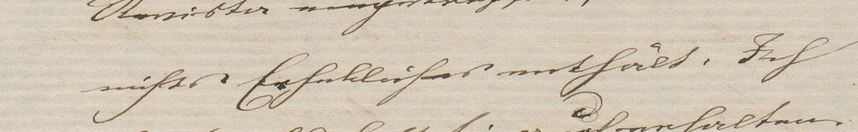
nichts Erhebliches enthält. Ich
